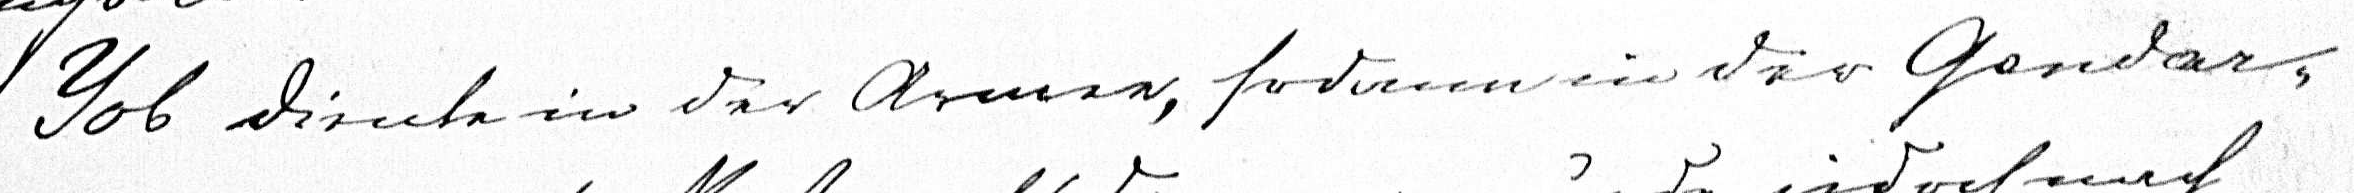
Job diente in der Armee, sodann in der Gendar¬
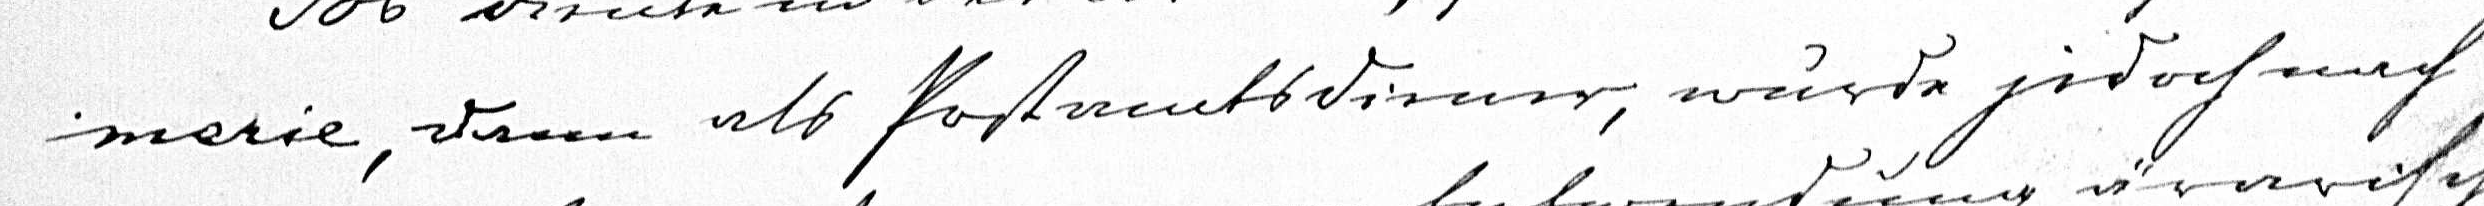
merie, dann als Postamtsdiener, wurde jedoch nach
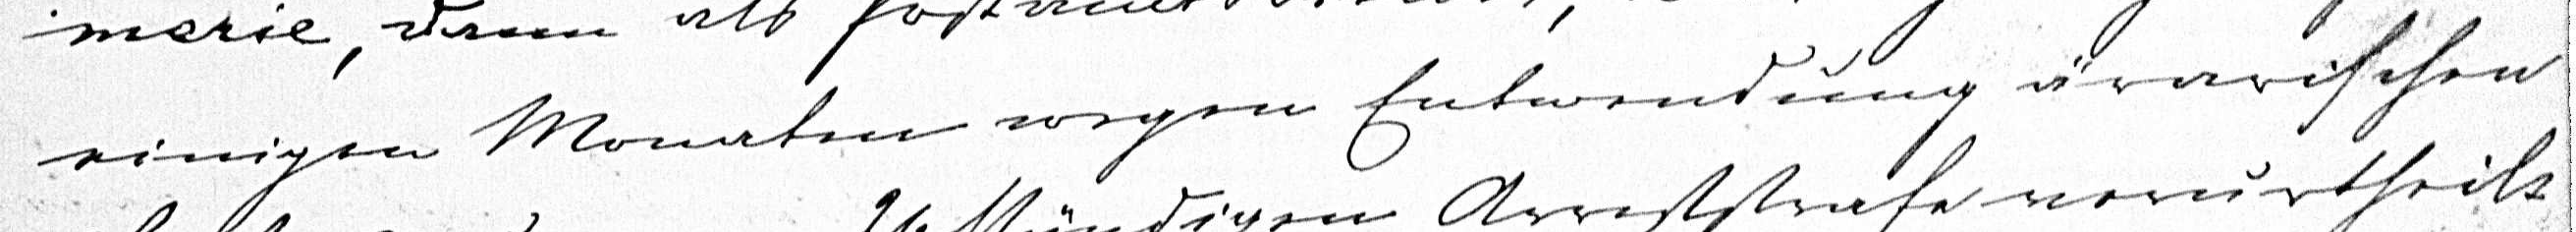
einigen Monaten wegen Entwendung ärarischen
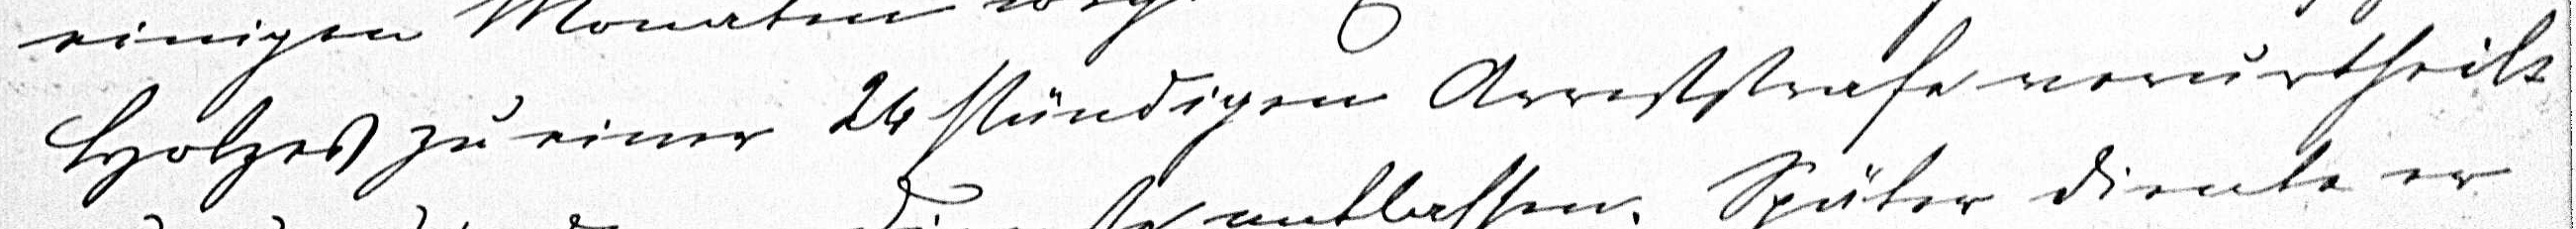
Holzes zu einer 24stündigen Arreststrafe verurtheilt
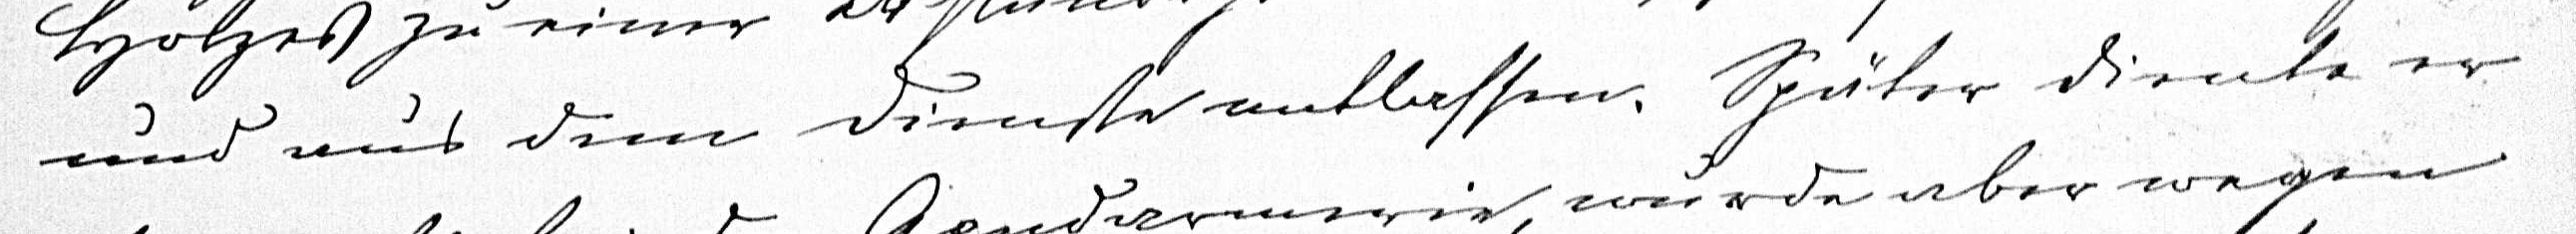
und aus dem Dienste entlassen. Später diente er
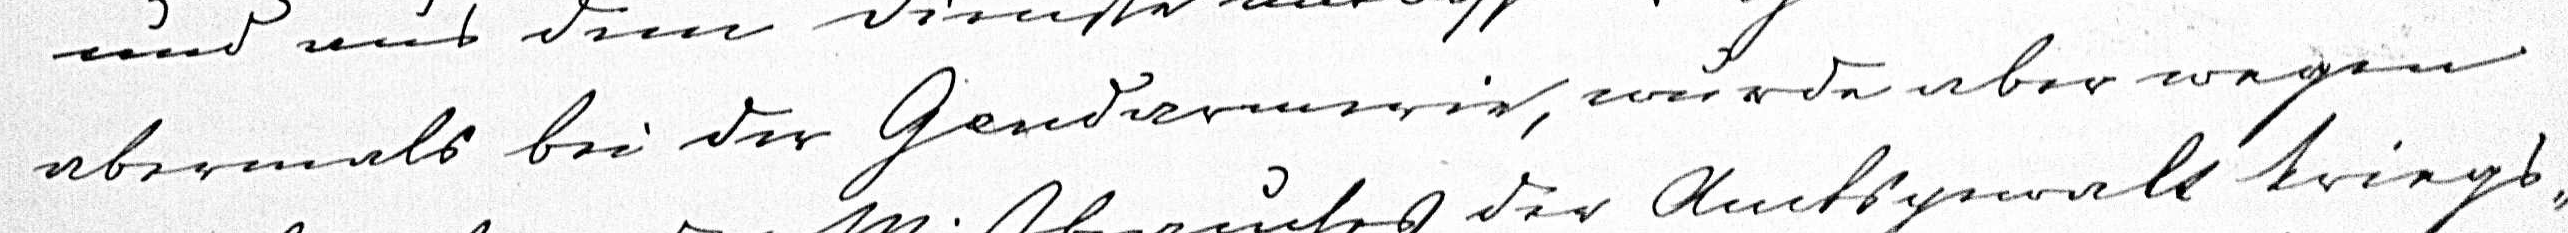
abermals bei der Gendarmerie, wurde aber wegen
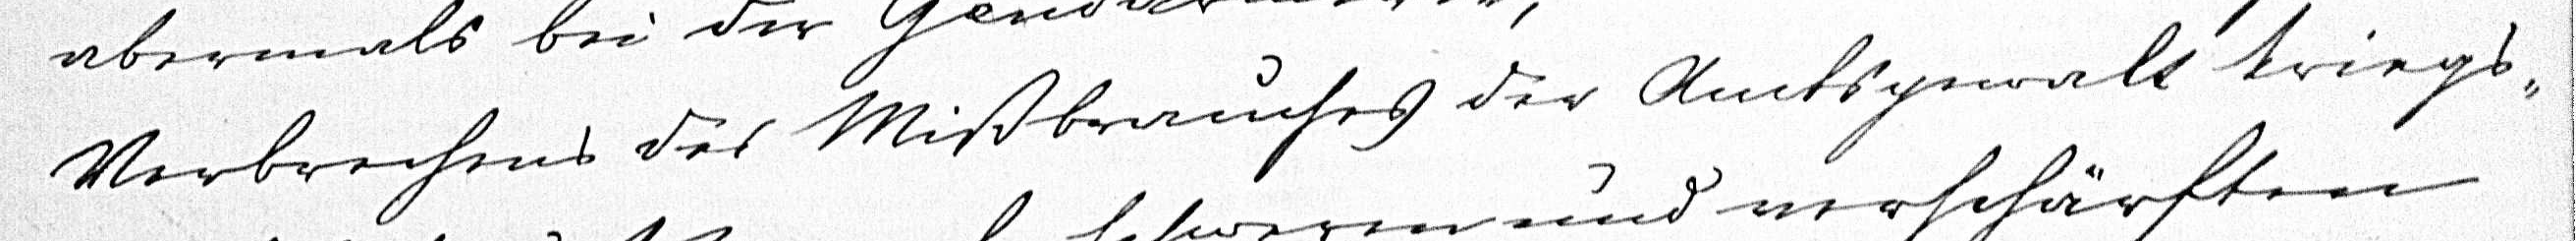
Verbrechens der Mißbrauches der Amtsgewalt kriegs¬
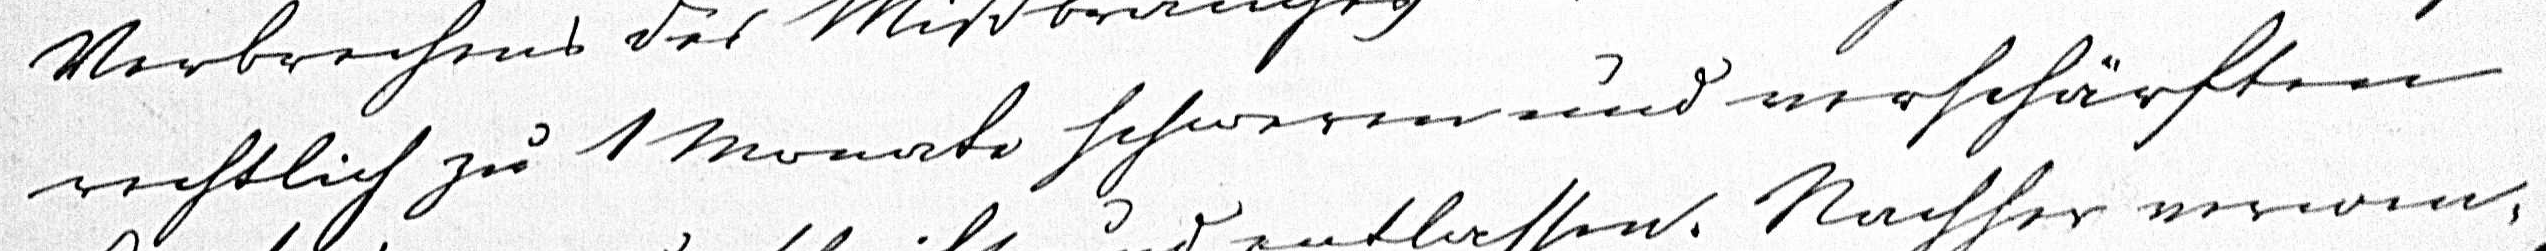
rechtlich zu 1 Monate schweren und verschärften
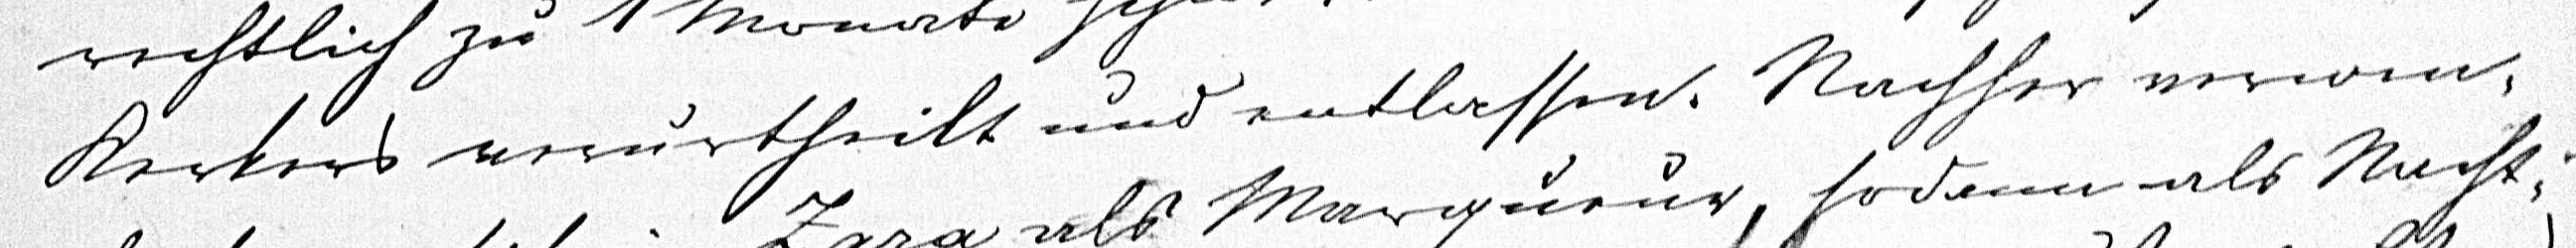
Kerkers verurtheilt und entlassen. Nachher verwen¬
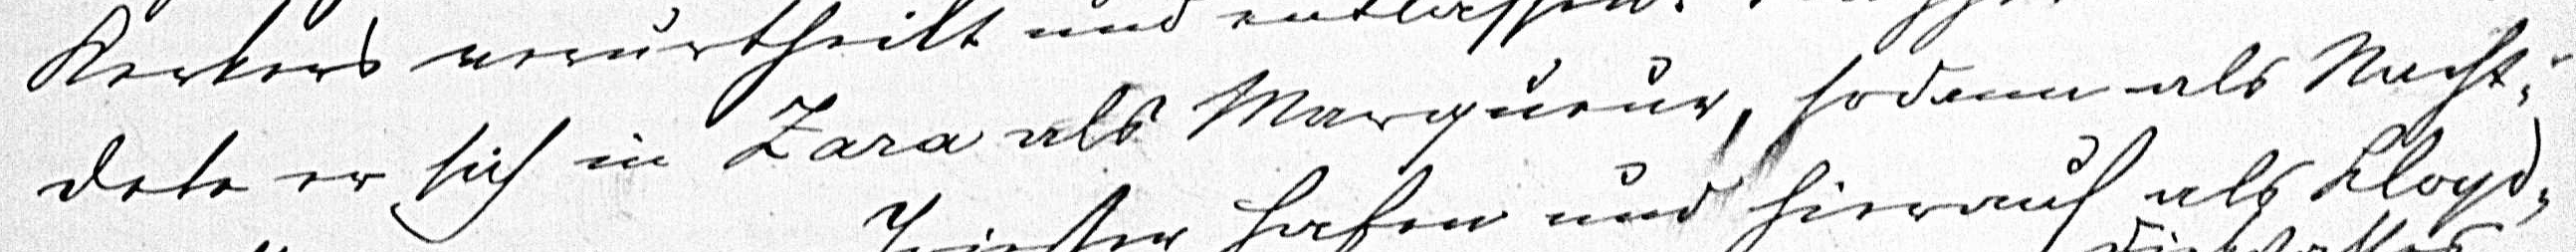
dete er sich in Zara als Marqueur, sodann als Nacht¬
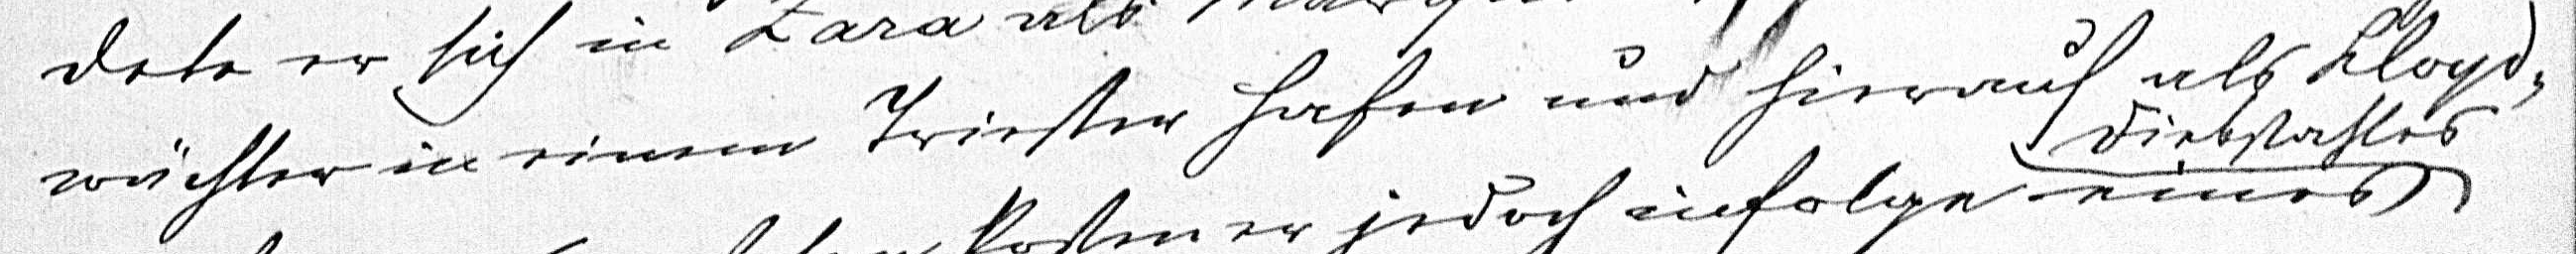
wächter in einem Triester Hafen und hierauf als Lloyd¬
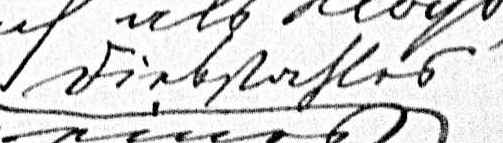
Diebstahles
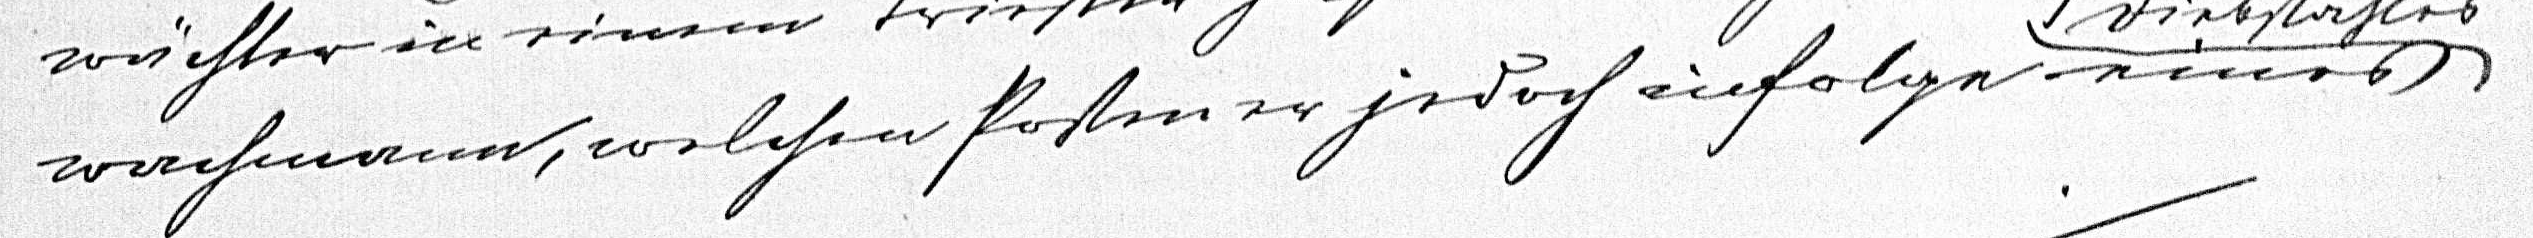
wachmann, welchen Posten er jedoch infolge eines
